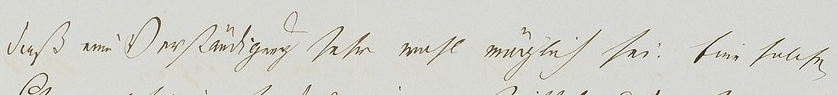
daß eine Verständigung sehr wohl möglich sei. Eine solche
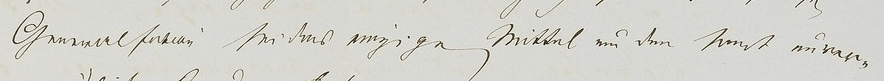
Generalfusion sei das einzige Mittel um den sonst unver-
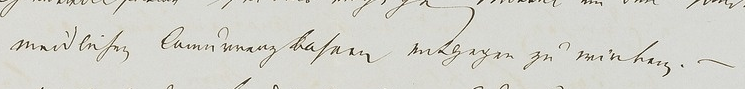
meidlichen Concurrenzbahnen entgegen zu wirken. –
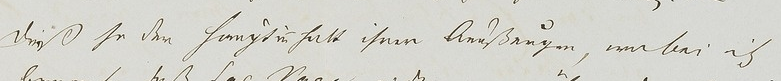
Dieß so der Hauptinnhalt ihrer Aeußerungen, wobei ich
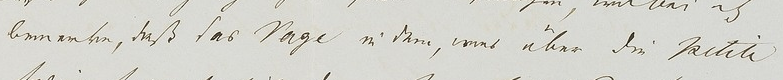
bemerke, daß das Vage in dem, was über die petite
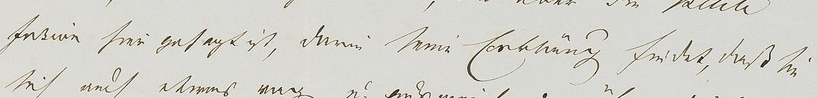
fusion hier gesagt ist, darin seine Erklärung findet, daß sie
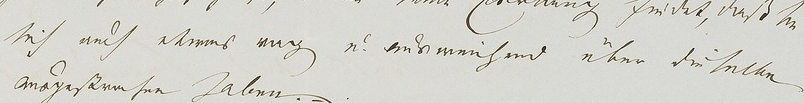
sich auch etwas vag u. ausweichend über dieselbe
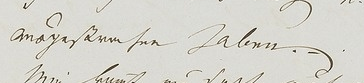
ausgesprochen haben. –
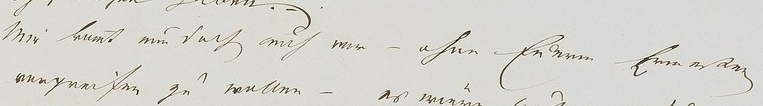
Mir kommt nun doch auch vor – ohne Euerm Ermeßen
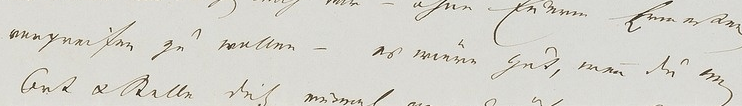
vorgreifen zu wollen – es wäre gut, wenn du an
